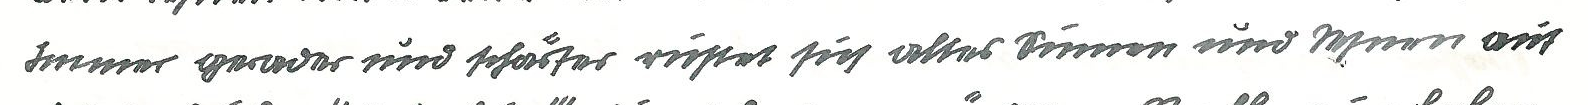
Immer gerader und schärfer richtet sich alles Sinnen und Sehnen auf
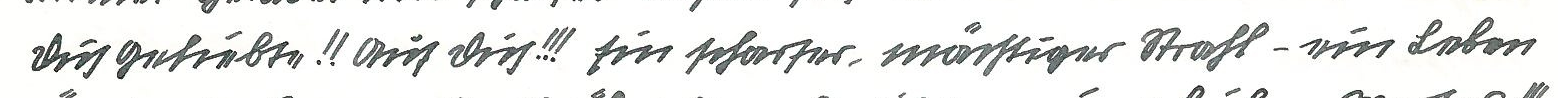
Dich Geliebte!! Auf Dich!!! Ein scharfer, mächtiger Strahl – ein Leben
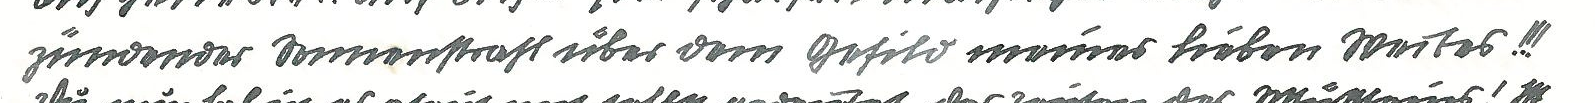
zündender Sonnenstrahl über dem Gefild meines lieben Weibes!!!
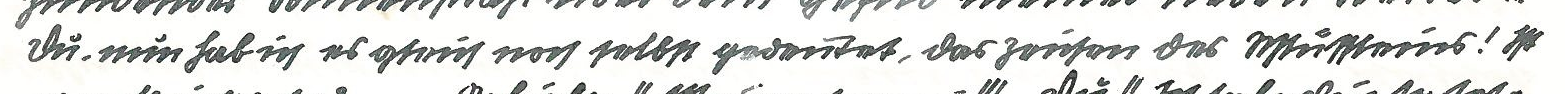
Du, nun hab ich es gleich noch selber gedeutet, das Zeichen des Schlüssleins! Ist
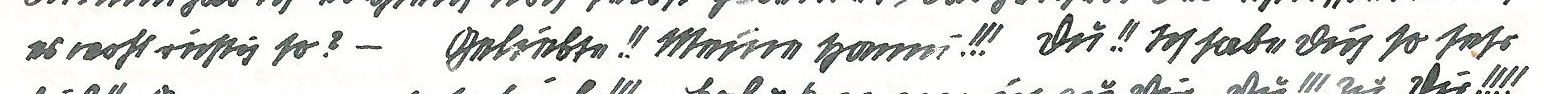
es wohl richtig so? – Geliebte!! Meine!!! Du!! Ich habe Dich so sehr
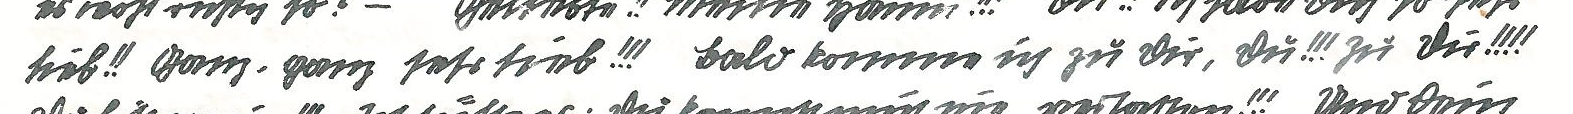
lieb!! Ganz, ganz so sehr lieb!!! Bald komm ich zu Dir, Du!!! Zu Dir!!!!
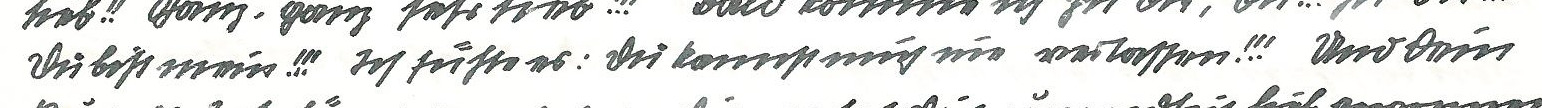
Du bist mein!!! Ich fühle es: Du kannst mich nie verlassen!!! Und Dein
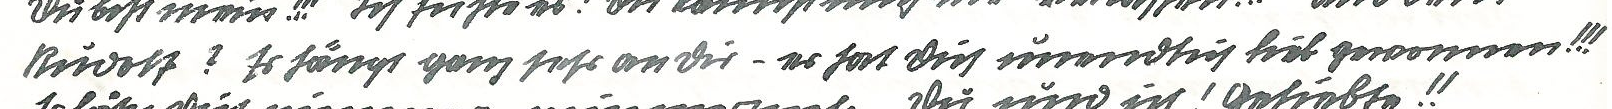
? Er hängt ganz sehr an Dir – er hat Dich unendlich lieb gewonnen!!!
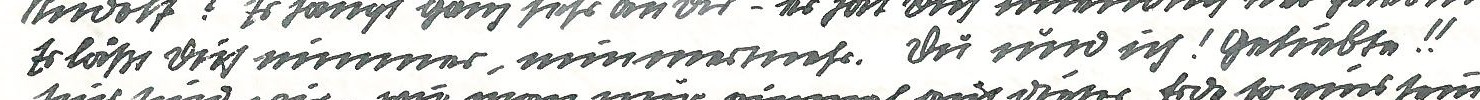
Er läßt Dich nimmer, nimmermehr. Du und ich! Geliebte!!
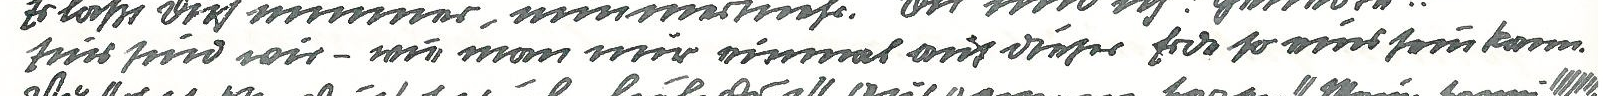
Eins sind wir – wie man nur einmal auf dieser Erde so eins sein kann.
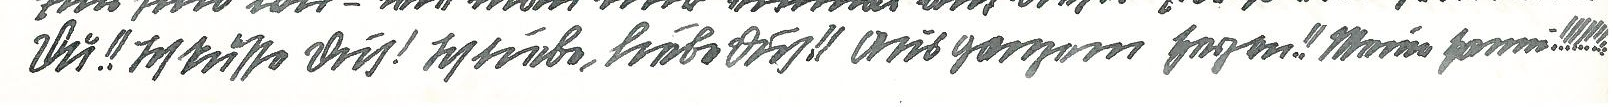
Du!! Ich küsse Dich! Ich liebe, liebe Dich!! Aus ganzem Herzen!! Meine!!!!!!!!!
